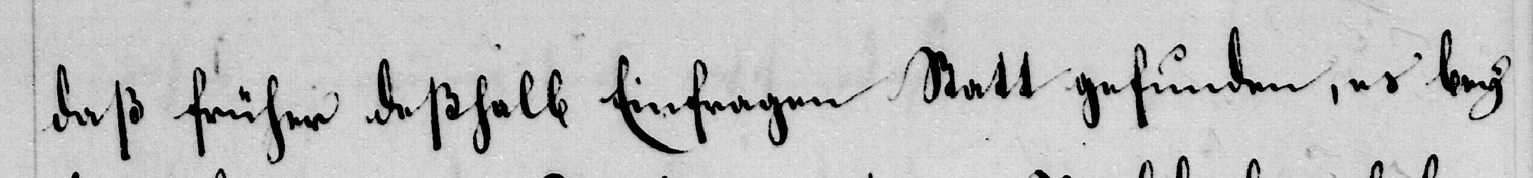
daß früher deβhalb Einfragen Statt gefunden, es bey
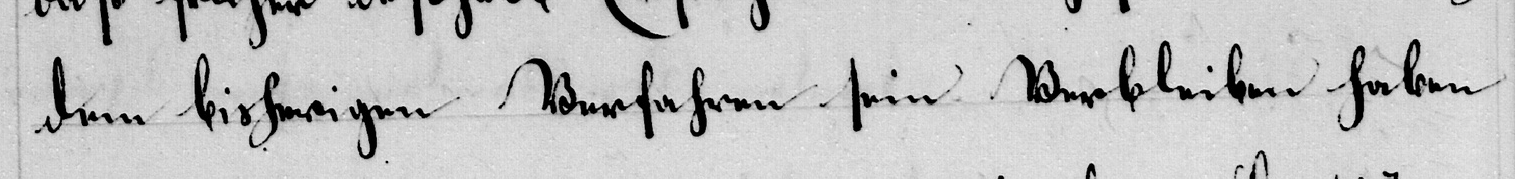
dem bisherigen Verfahren sein Verbleiben haben
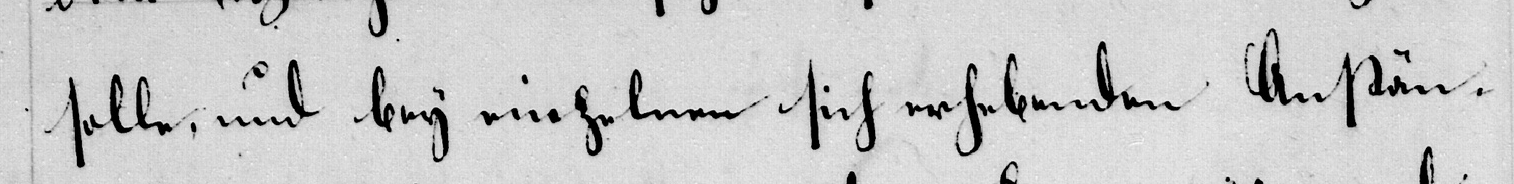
solle, und bey einzelnen sich erhebenden Anstän¬
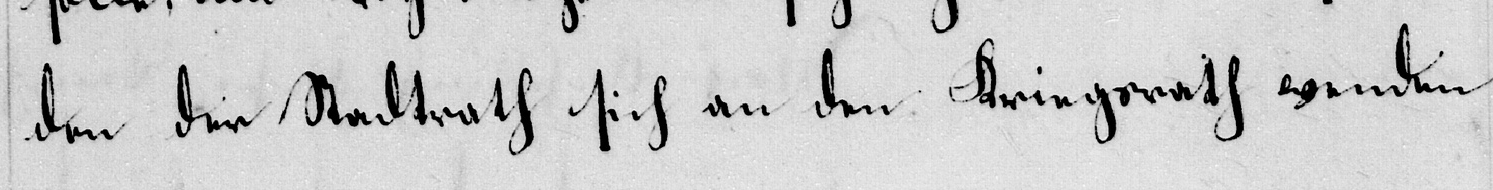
den der Stadtrath sich an den Kriegsrath wenden
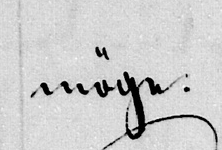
möge.
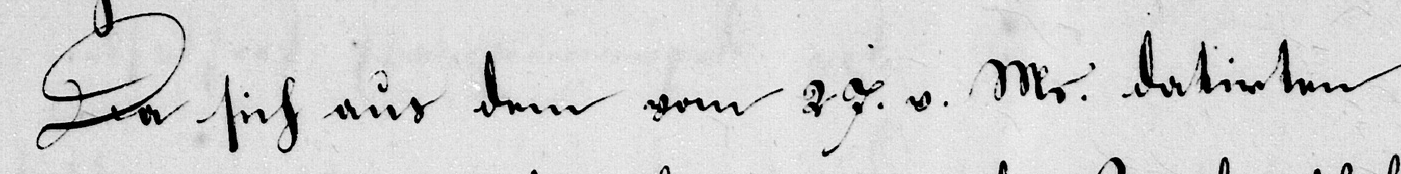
Da sich aus dem vom 27. v. Ms. datirten
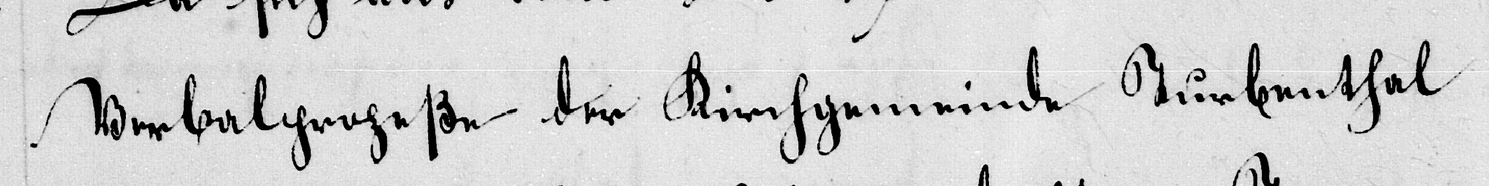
Verbalprozeße der Kirchgemeinde Turbenthal
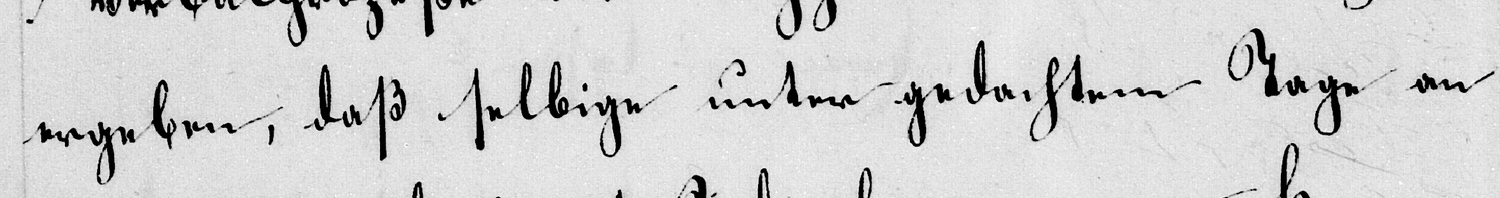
ergeben, daß selbige unter gedachtem Tage an
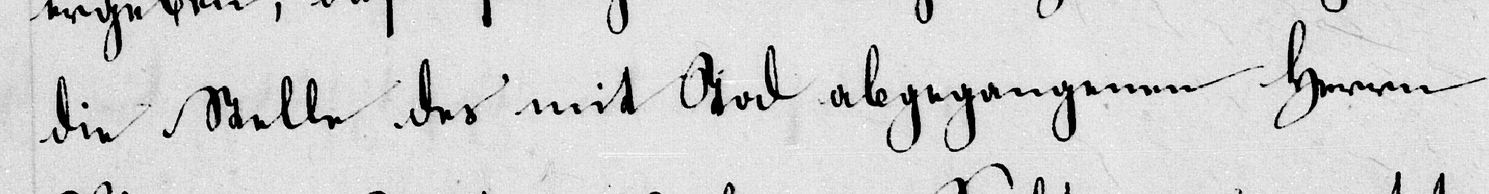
die Stelle des mit Tod abgegangenen Herrn
